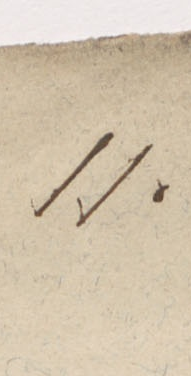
20
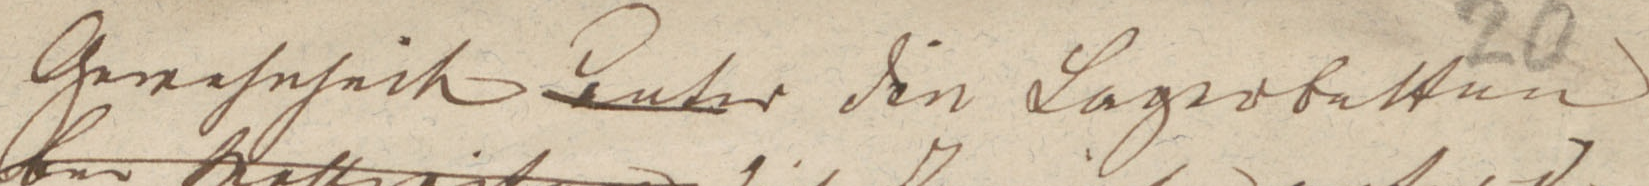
Gewohnheit unter deie Lagerbetten
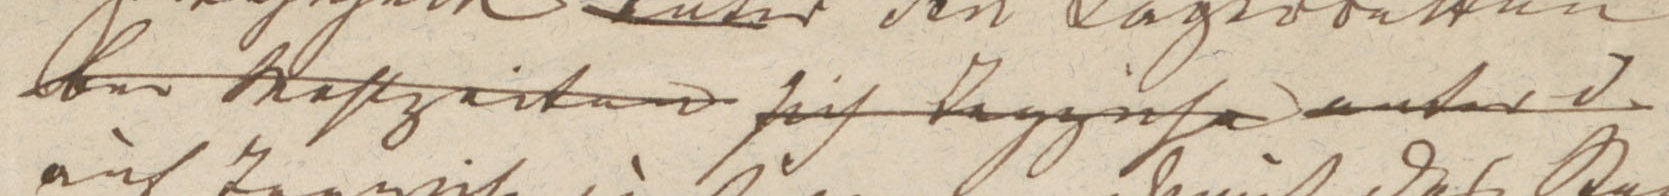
bei Mahlzeiten sich Teppiche unter d
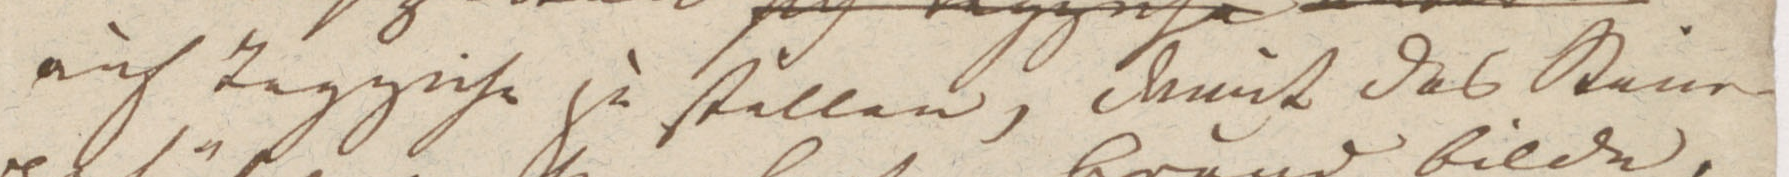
auf Teppiche zu stellen, damit das Stein-
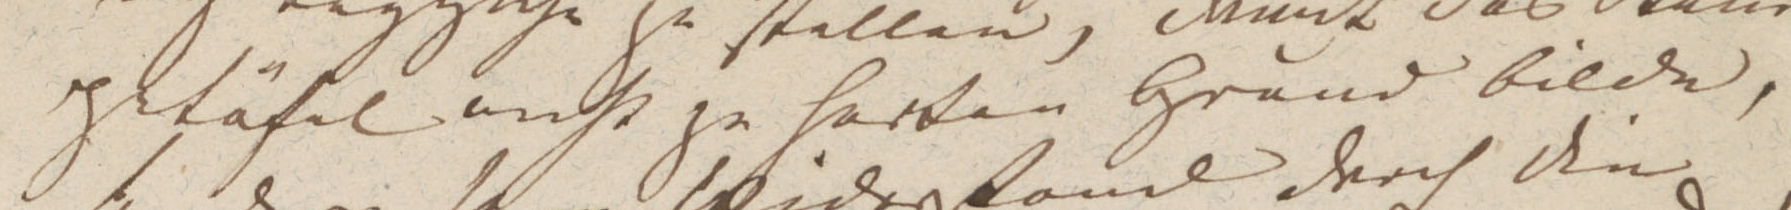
getäfel nicht zu harten Grund bilde,
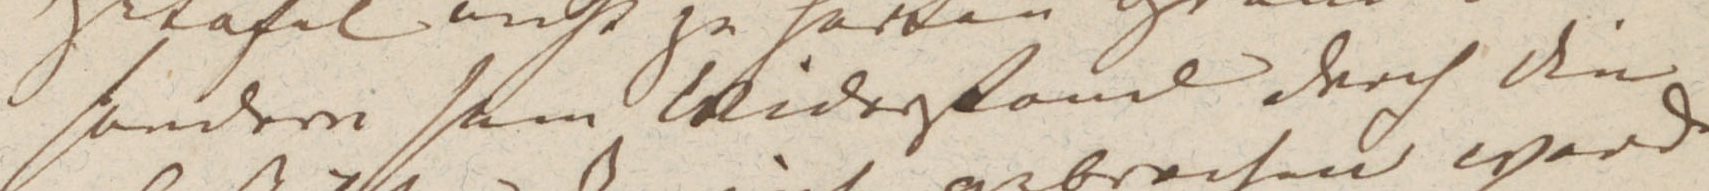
sondern sein Widerstand durch die
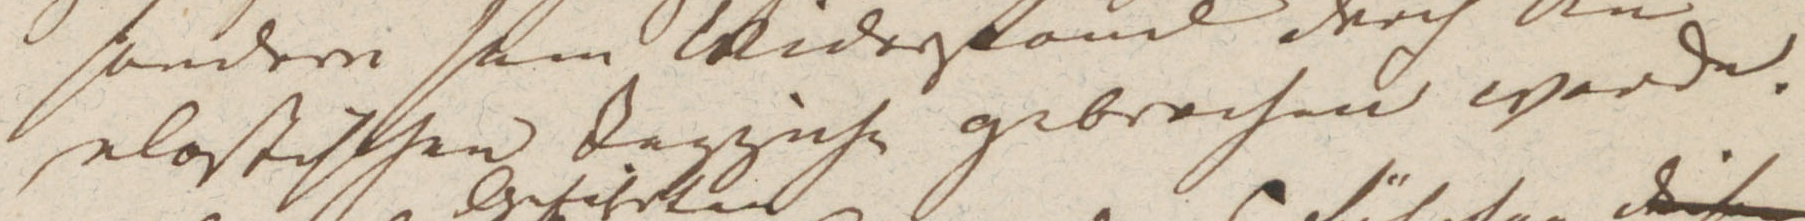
elastischen Teppiche gebrochen werde.
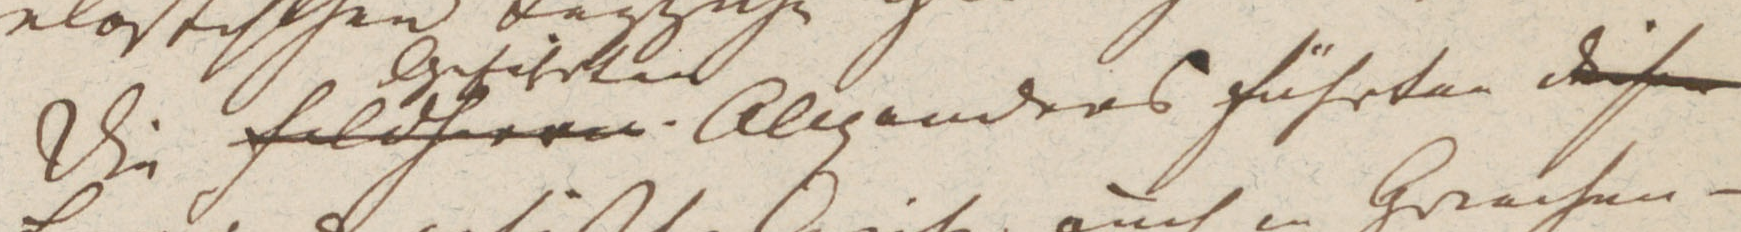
Die Feldherr Gefährten Alexanders führten diesen
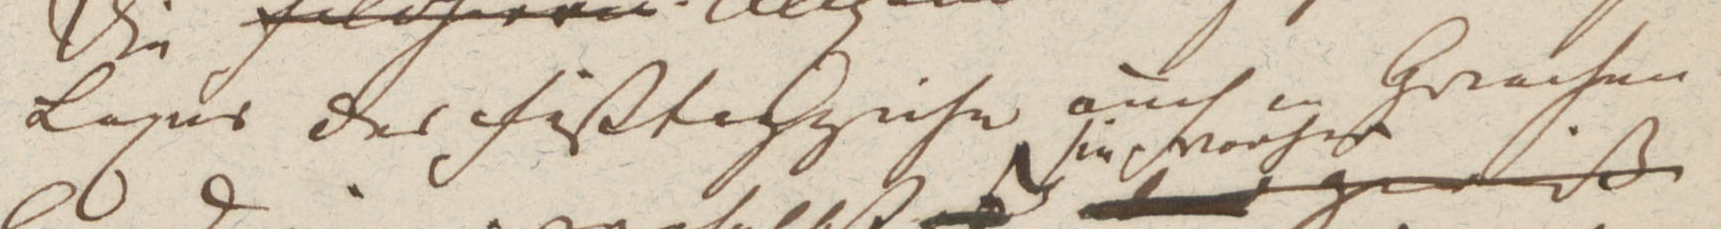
Luxus der Fussteppiche auch in Griechen-
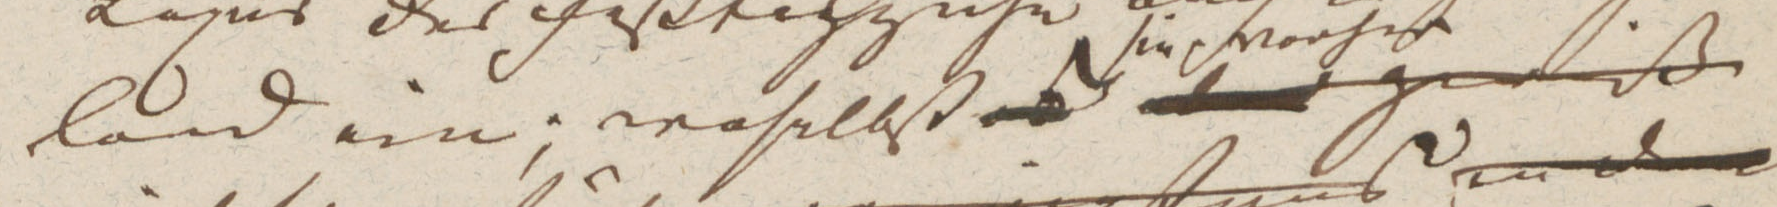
land ein; woselbst es gewiss sie
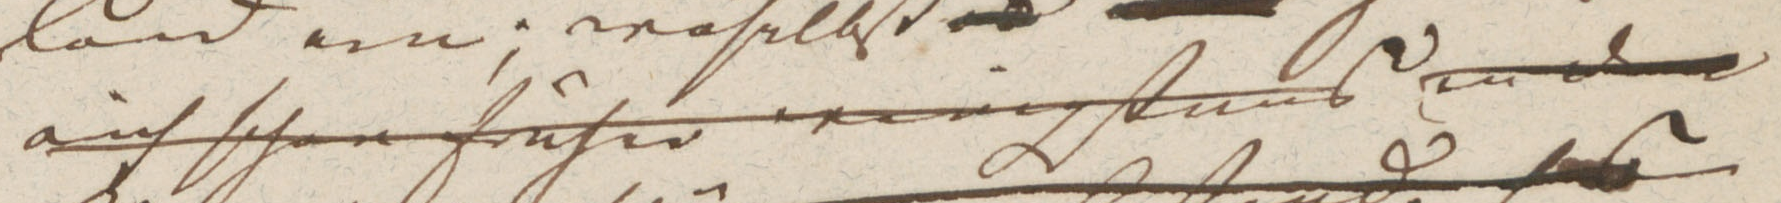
auch schon früher wenigstens in den
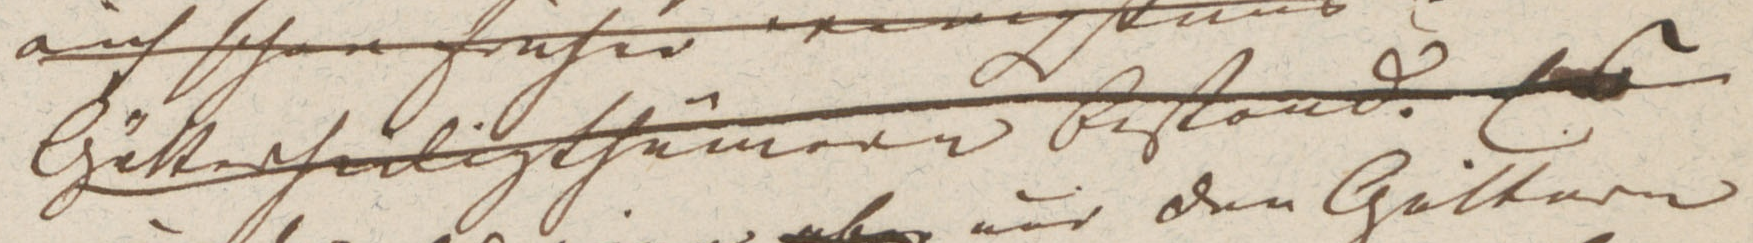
Götterheiligthümern bestand. Es
